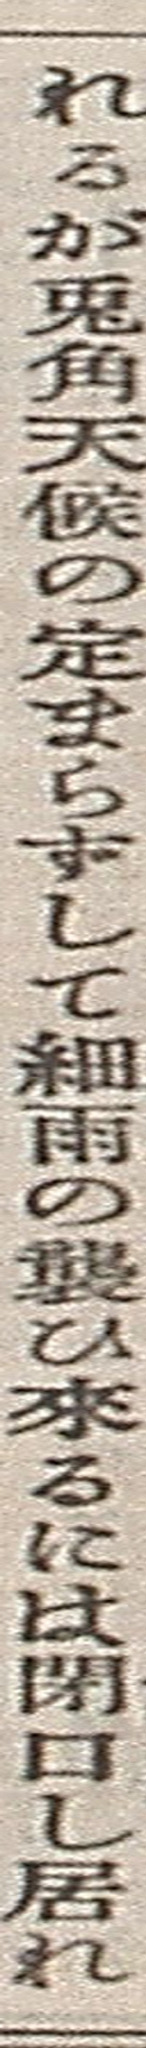れるが兎角天候の定まらずして細雨の襲ひ来るには閉口し居れ
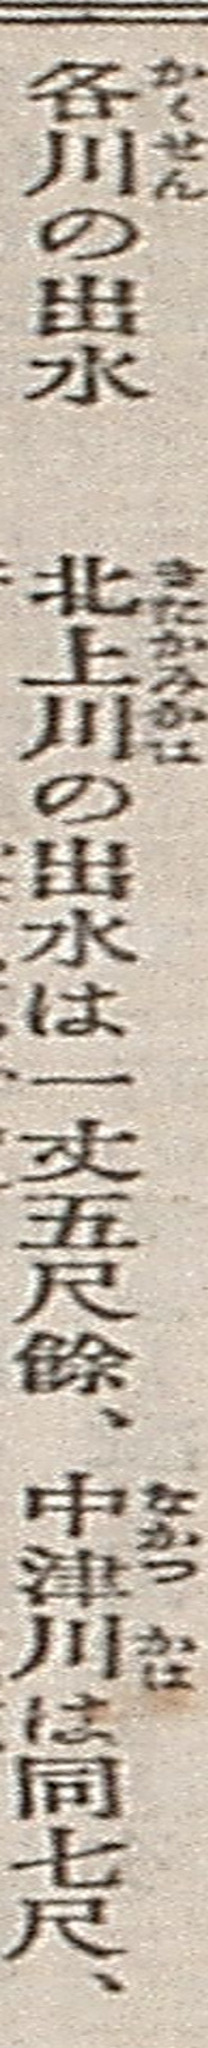各川の出水北上川の出水は一丈五尺餘、中津川は同七尺、
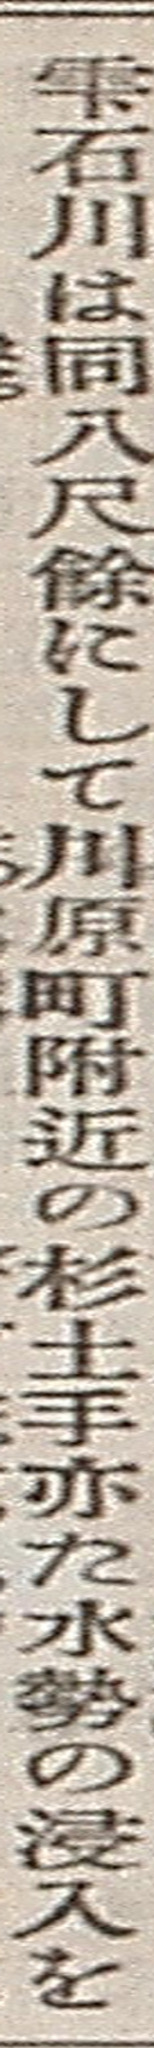雫石川は同八尺餘にして川原町附近の杉土手亦た水勢の侵入を
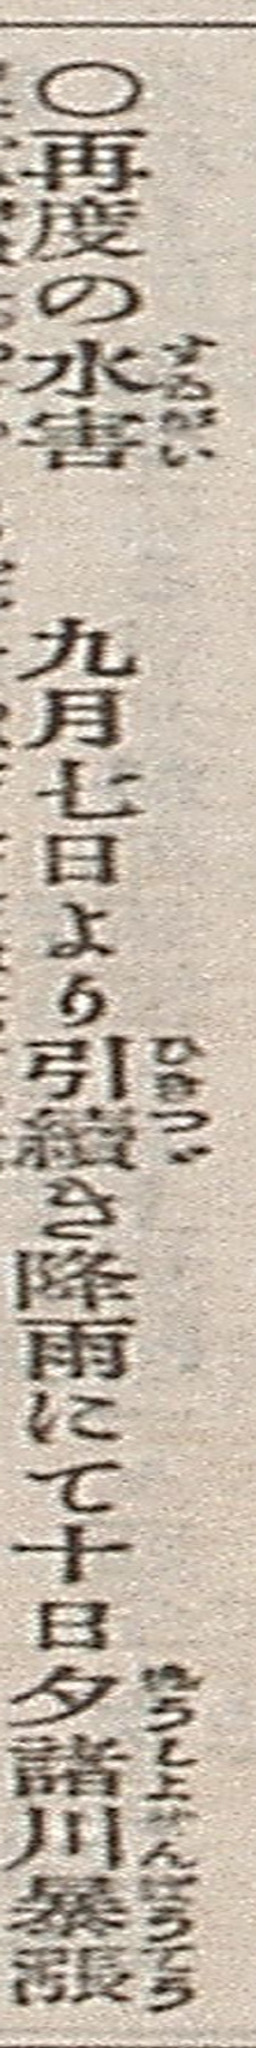○再度の水害九月七日より引続き降雨にて十日夕諸川暴漲
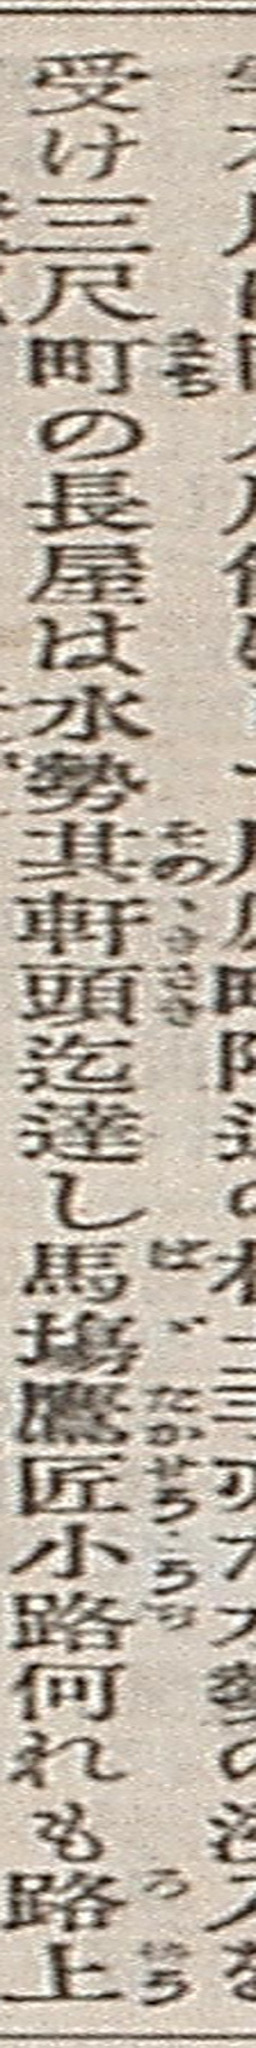受け三尺町の長屋は水勢其軒頭迄達し馬場鷹匠小路何れも路上
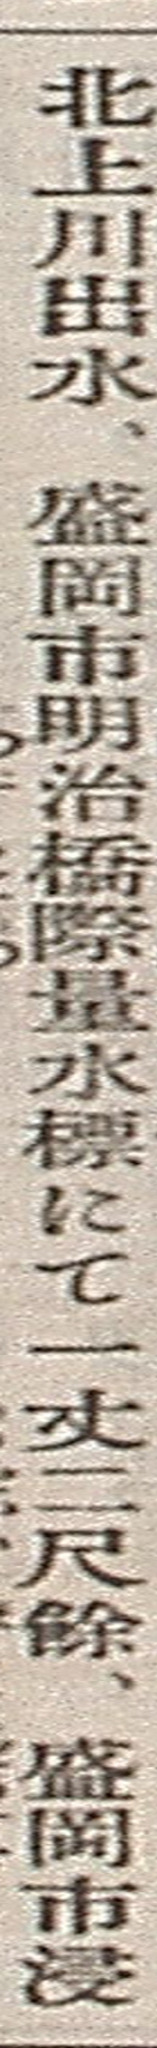北上川出水、盛岡市明治橋際量水標にて一丈二尺餘、盛岡市浸
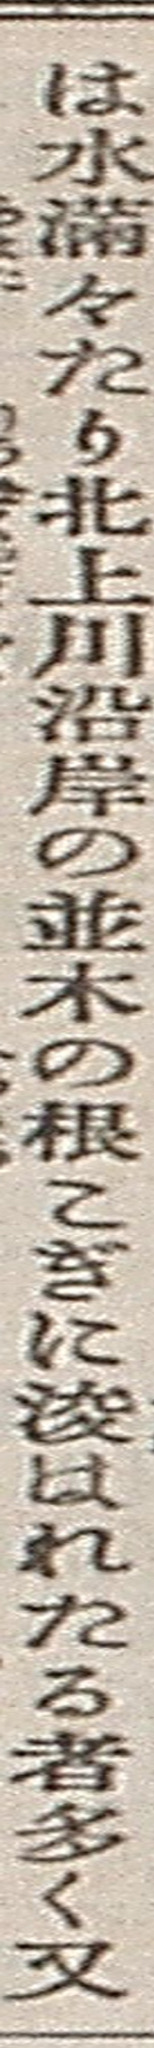は水満々たり北上川沿岸の並木の根こぎに浚はれたる者多く又
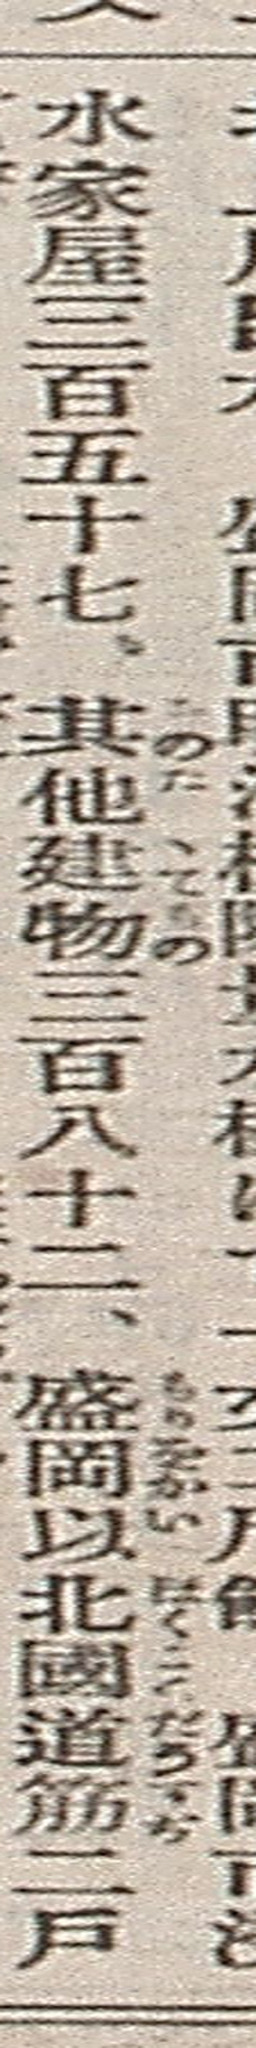水家屋三百五十七、其他建物三百八十二、盛岡以北北国道筋二戸
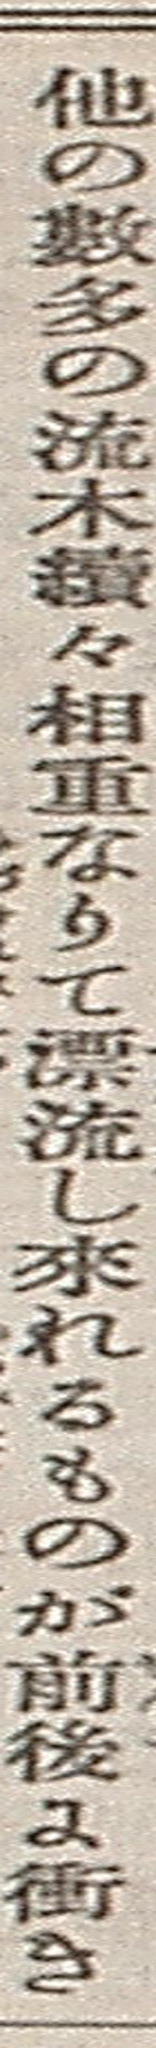他の数多の流木続々相重なりて漂流し来れるものが前後に衝き
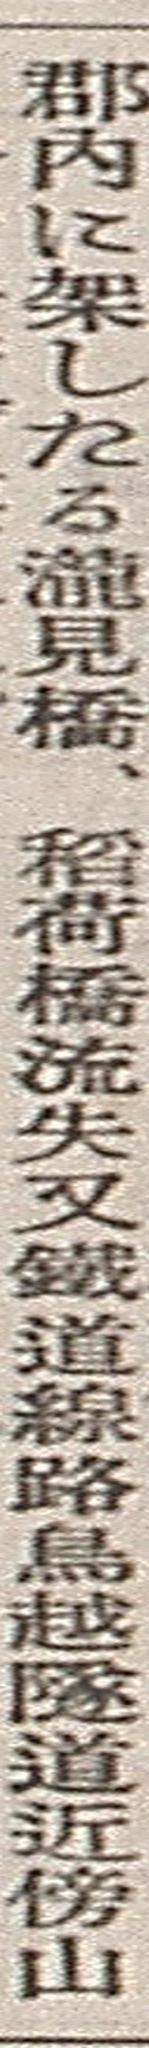郡内に架したる瀧見橋、稲荷橋流失又鉄道線路鳥越遂道近傍山
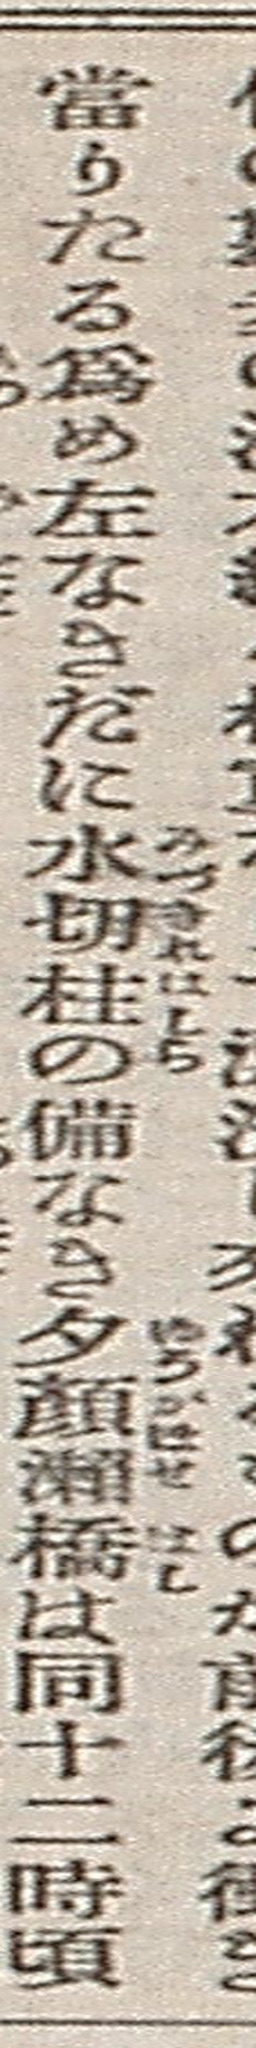当りたる為め左なきだに水切柱の備なき夕顔瀬橋は同十二時頃
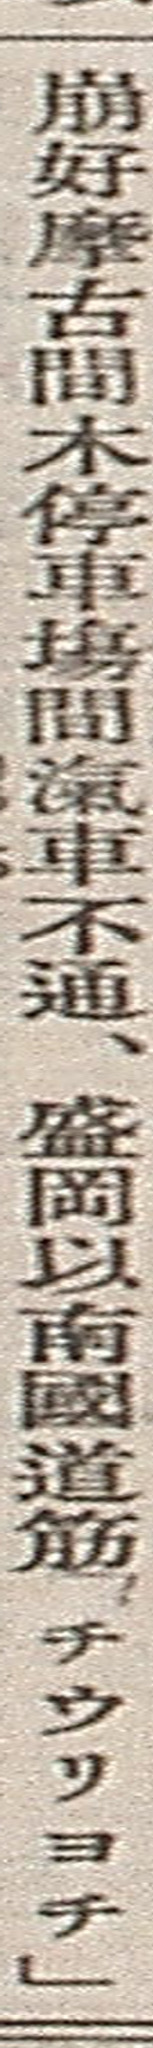崩古摩古間木停車場間汽車不通、毬岡以南国道筋「チウリヨチ」
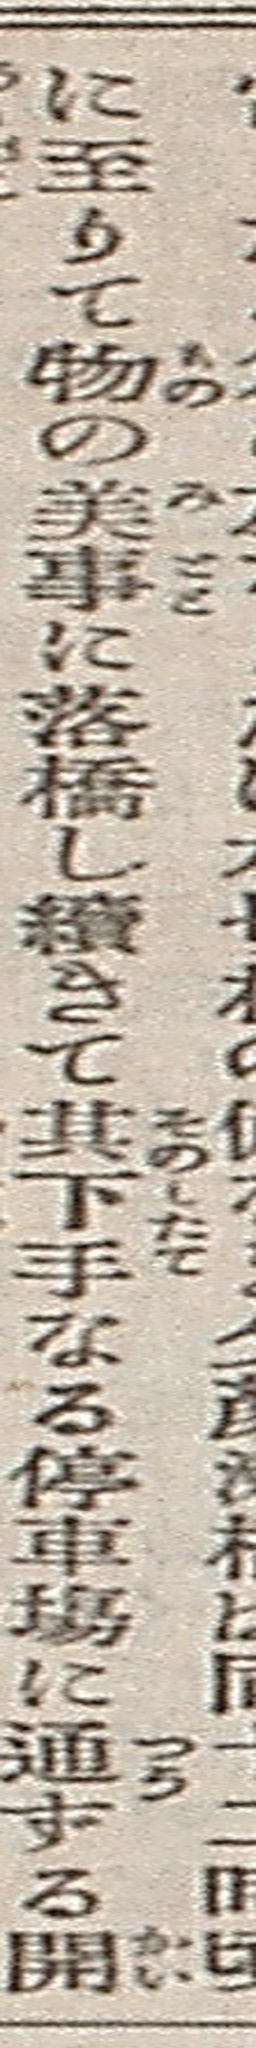に至りて物の見事に落橋し続きて其下手なる停車場に通ずる開
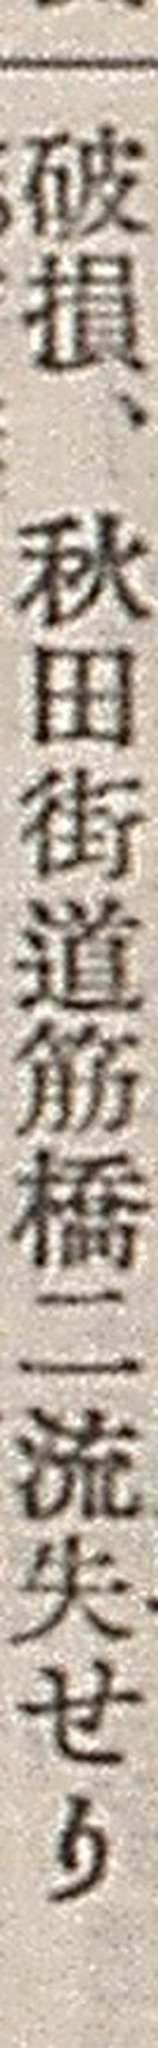破損、秋田街道筋橋二流失せり
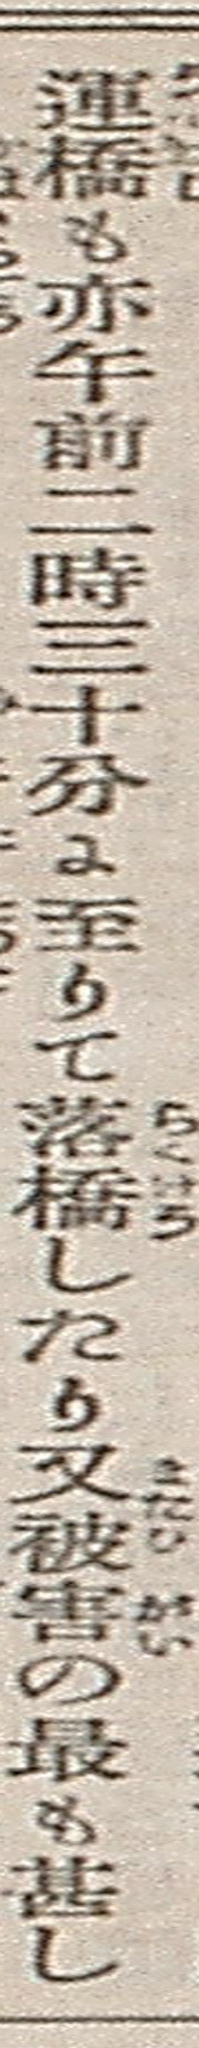運橋も亦午前二時三十分に至りて落橋したり又被害の最も甚し
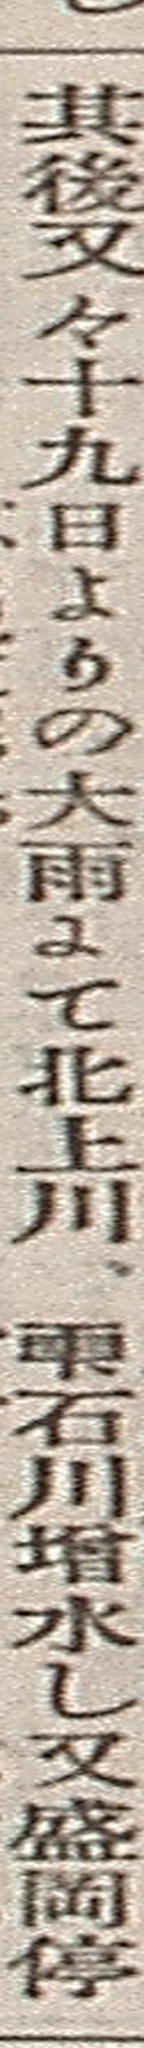其後又々十九日よりの大雨にて北上川、雫石川増水し又盛岡停
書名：風俗畫報臨時増刊第百二十八號　洪水被害録（下）
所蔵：東京大学地震研究所図書室 Earthquake Research Institute Library, The University of Tokyo, JAPAN
